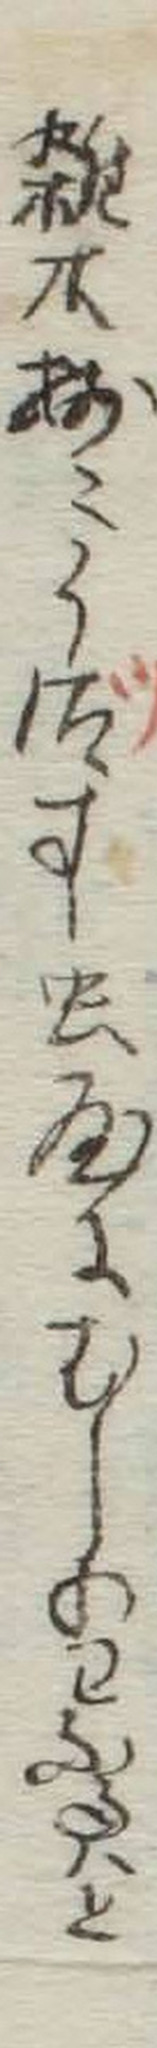雑木抄ニうつす虫屋にむしのわふるはと
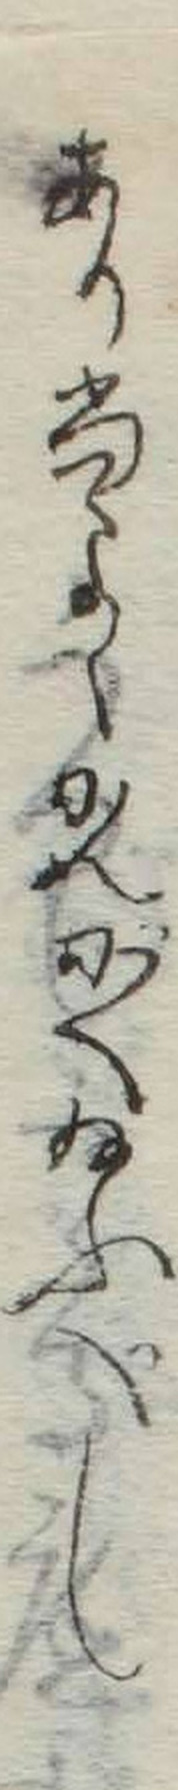あり尚よくかんがへたまふべし
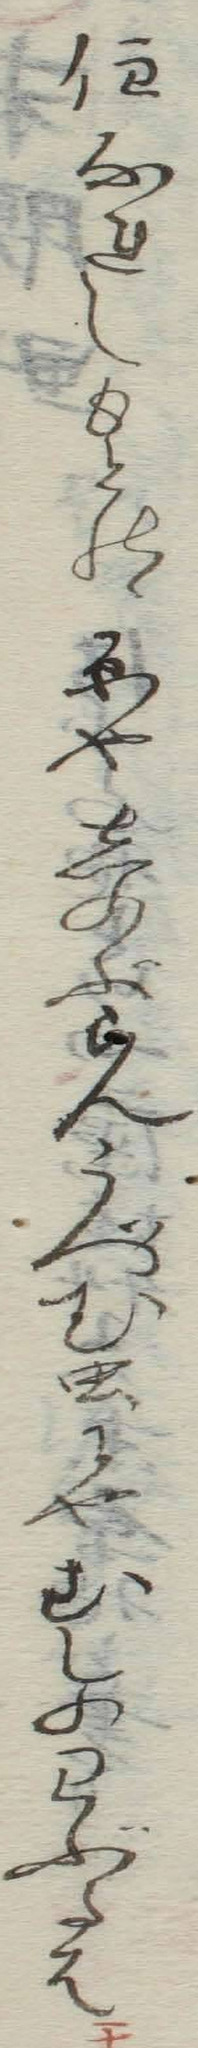住なれしもとのゝ原やしのぶらんうづむ虫にやむしのわぶるはモ
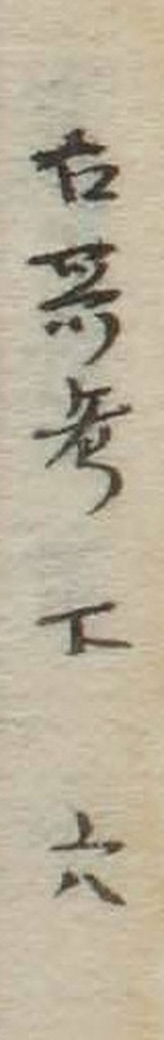古歌考下六

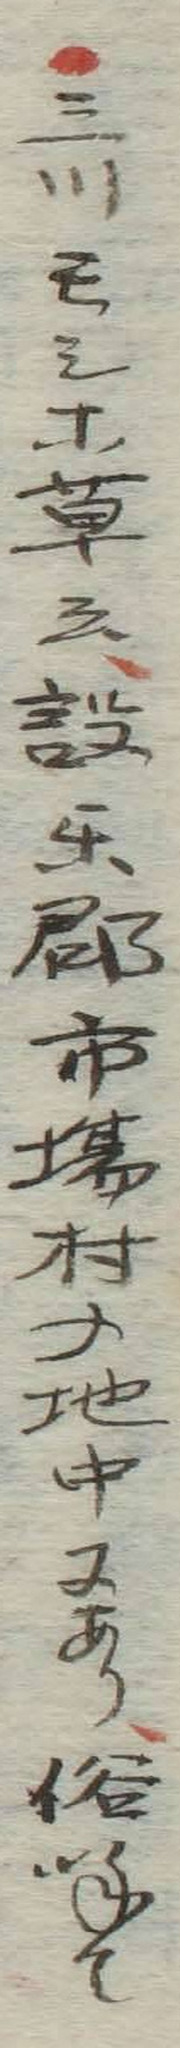○末腹野●三川モシホ草云、設楽郡市場村の地中にあり、俗呼て
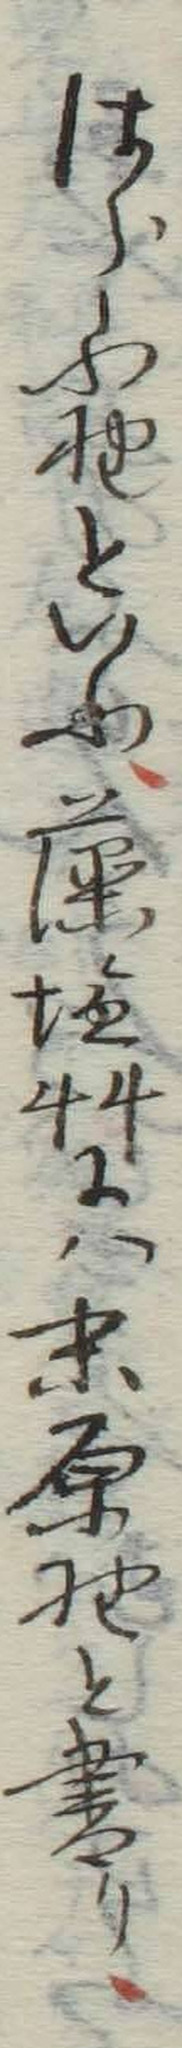はらふ野といふ、藻塩艸には末原野と書り、
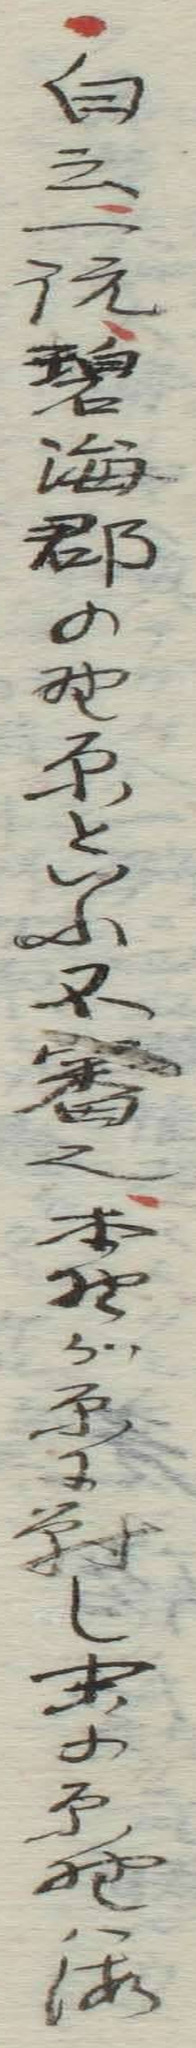●白云、一説、碧海郡の野原といふ不審也、本野が原に対し末の原野は海
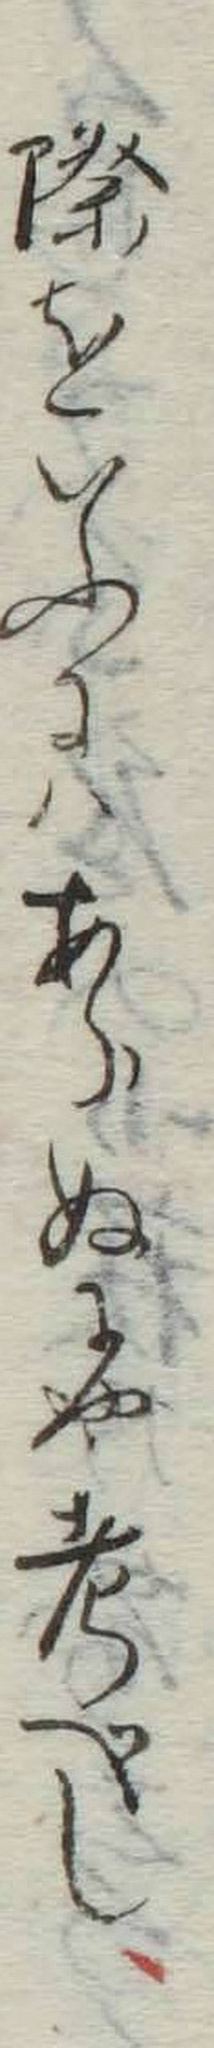際をいふにはあらぬにや考べし、
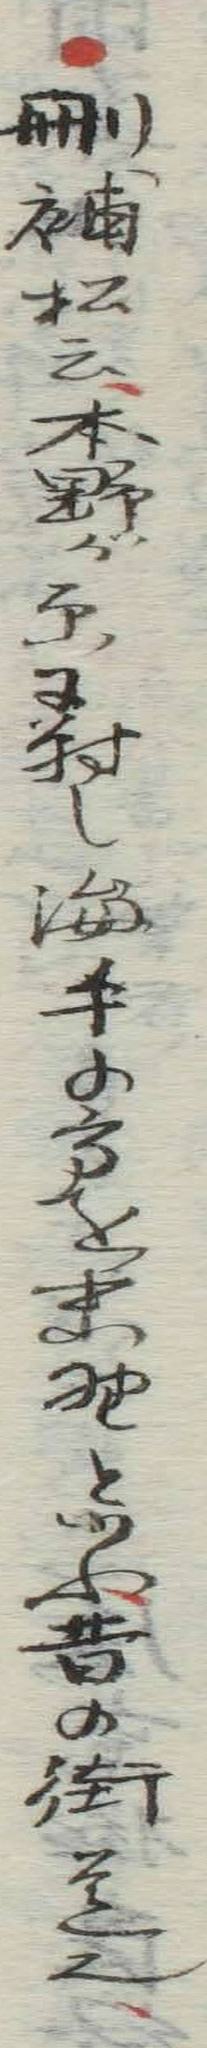●刪補松云、本野が原に対し海手の方を末野といふ、昔の街道也、
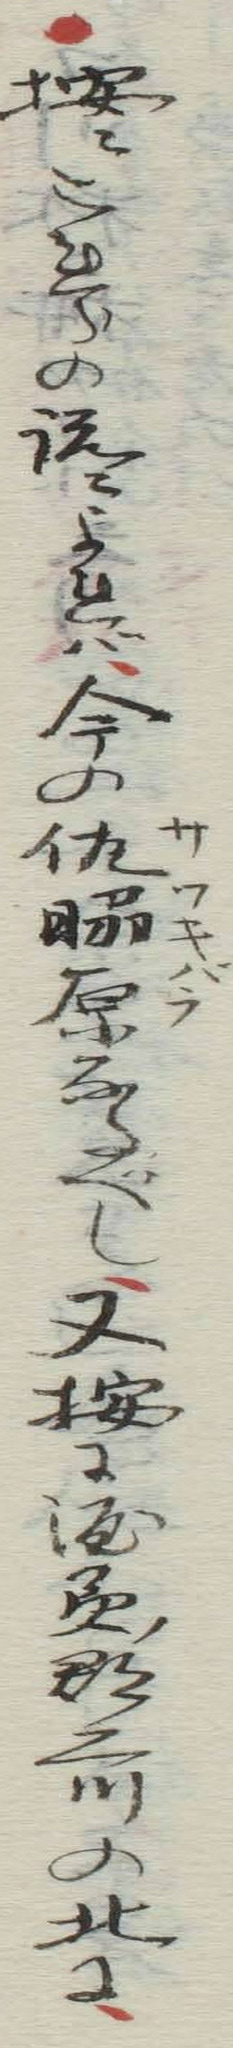●按ニこれらの説ニよれば、今の佐脇原なるべし、又按に渥美郡二川の北に、
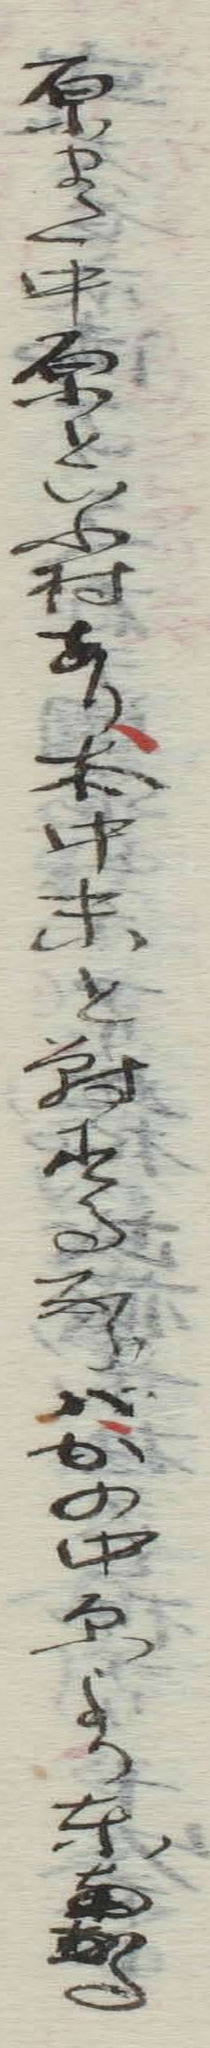原また中原といふ村あり、本中末と対するならば、かの中原より東南なる
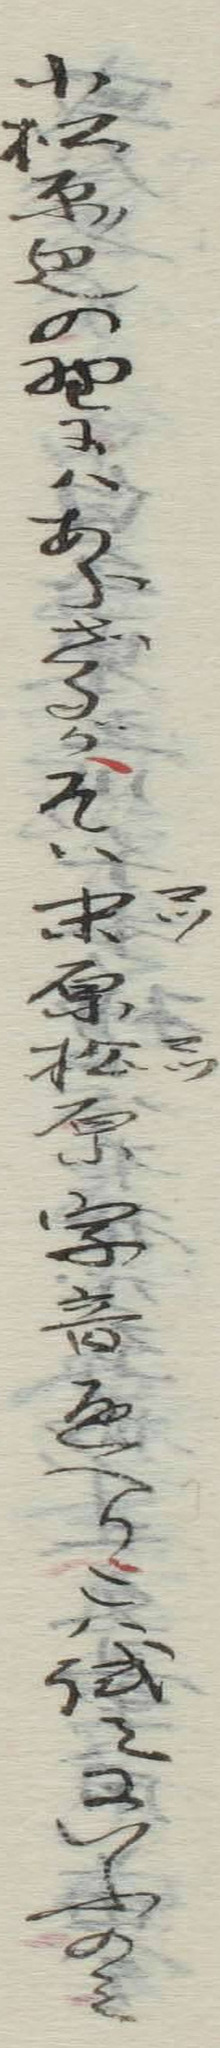小松原辺の野にはあらざるが、そは末原松原字音通へり、こは試みにいふのみ
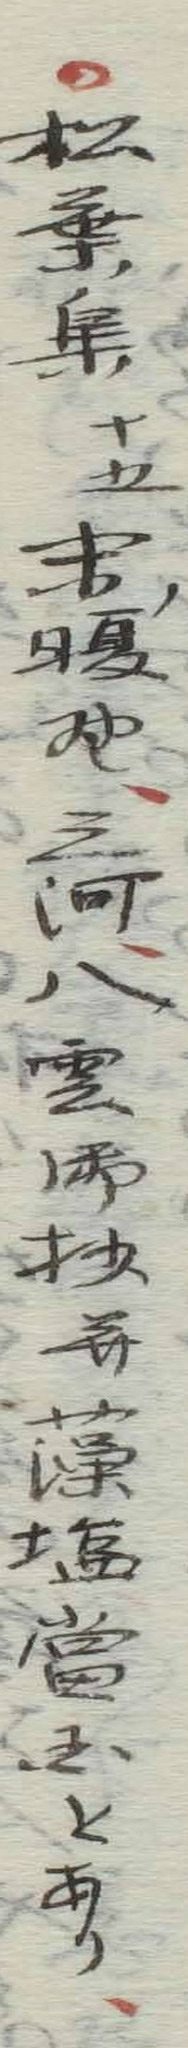●松葉集十五末腹野、三河、八雲御抄并藻塩当国とあり、
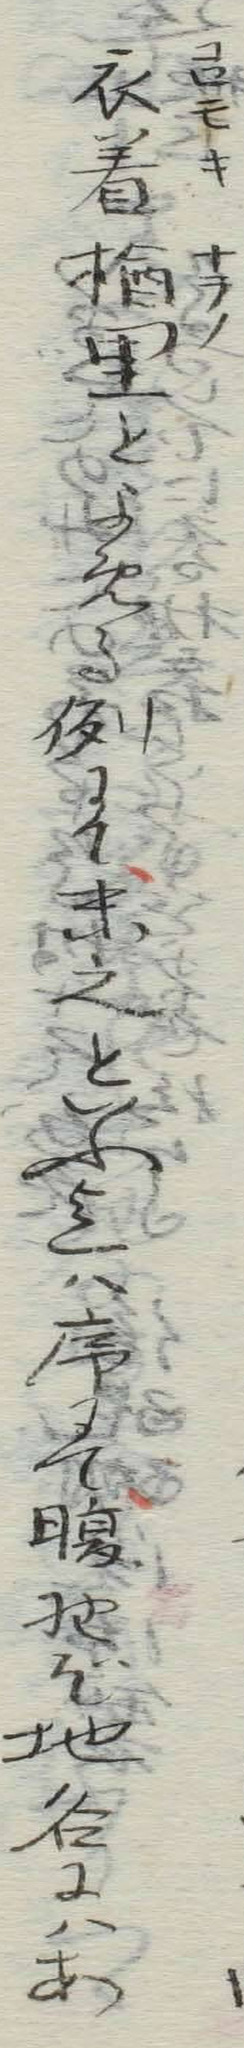衣着楢里とよめる例にて、末之といふ迄は序にて腹野ぞ地名にはあ
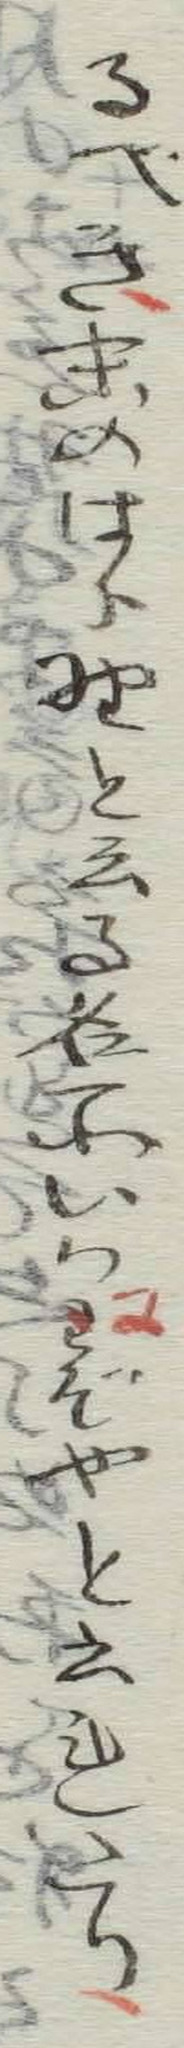るべき、末のはら野と云る名所いかにぞやと云れたり、
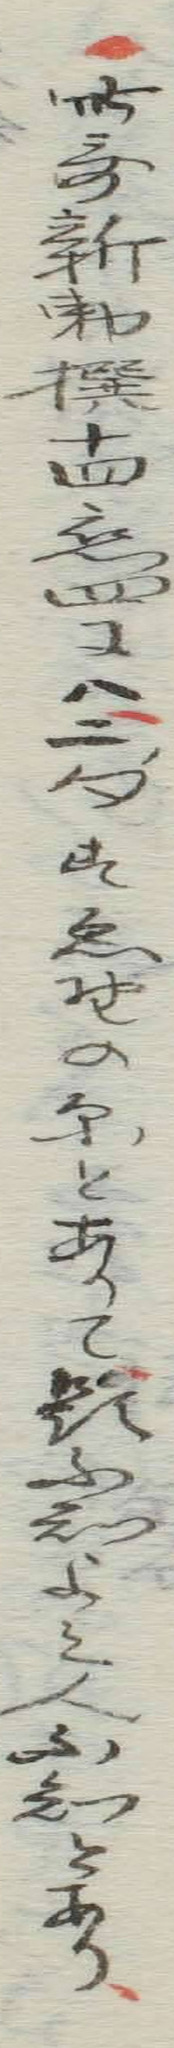●此歌新勅撰十四恋四には、二句すゑ野の原とありて、題不知よみ人不知とあり、
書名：三河国古跡考
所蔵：国文学研究資料館
